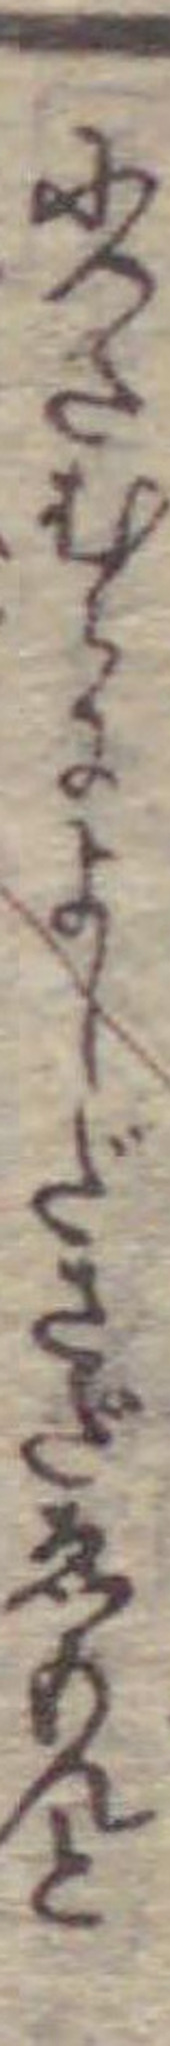につたむらによしださだゑもんと
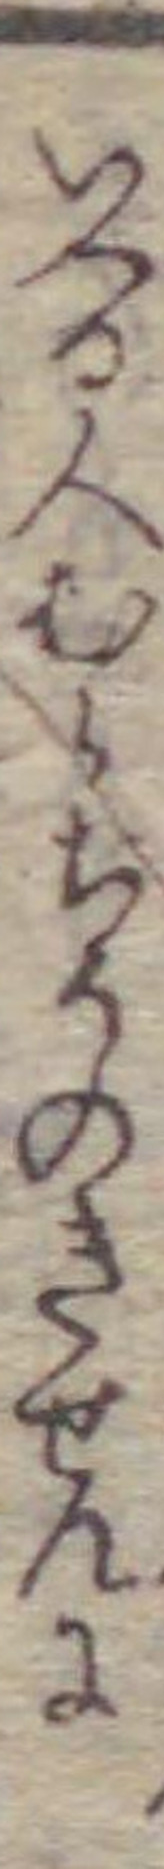いへる人むらぢうのきせんに
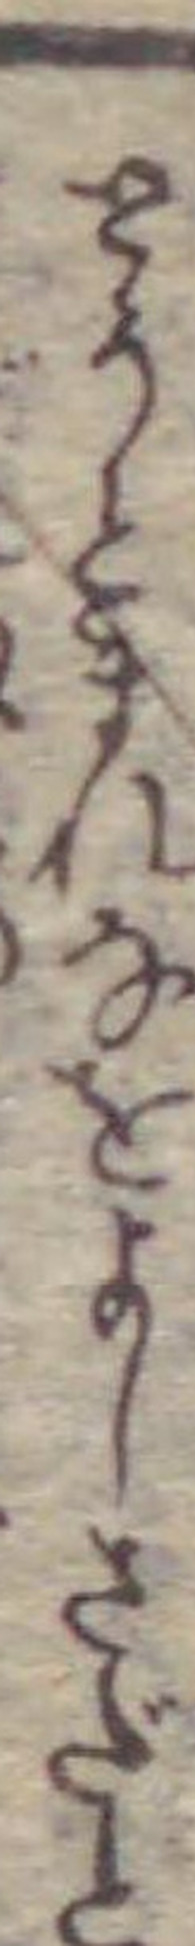とうとまれなをよしさだと
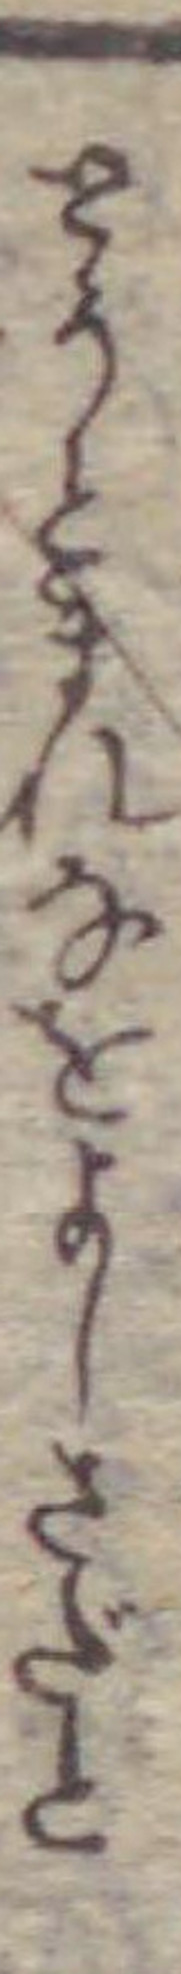とうとまれなをよしさだと
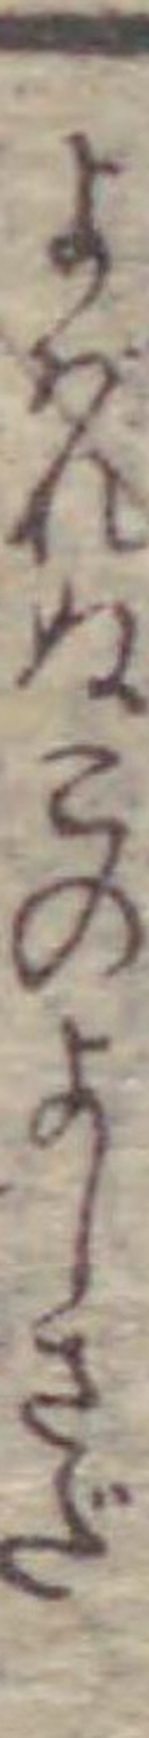よばれぬこのよしさだ
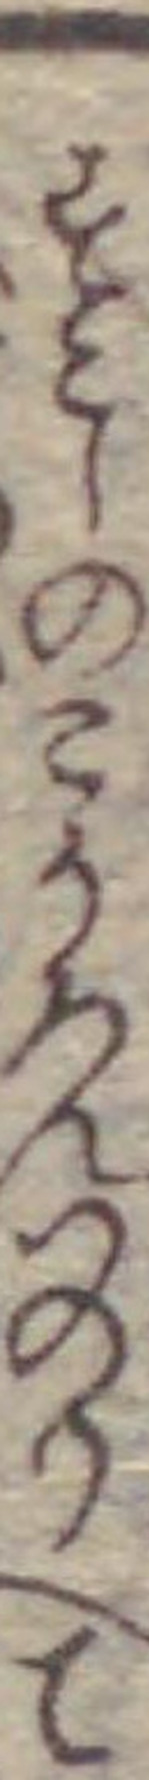すこしのこうろんつのりて
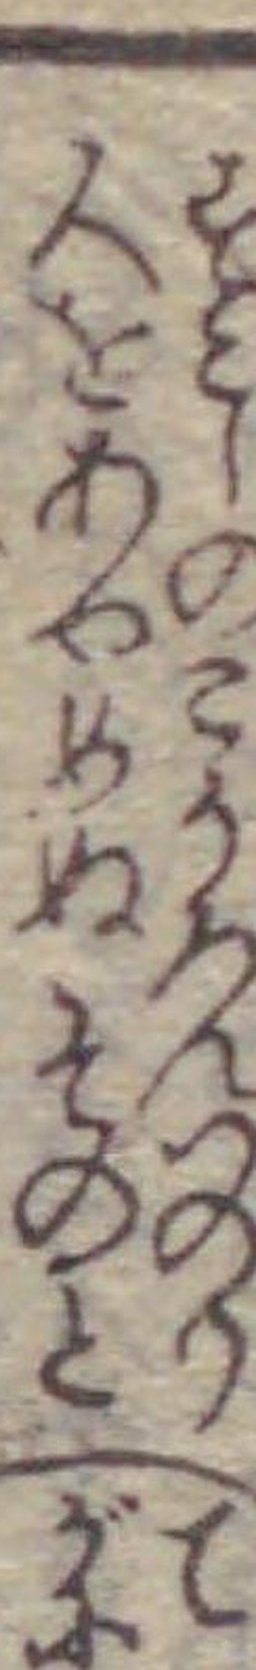人をあやめぬそのとがに
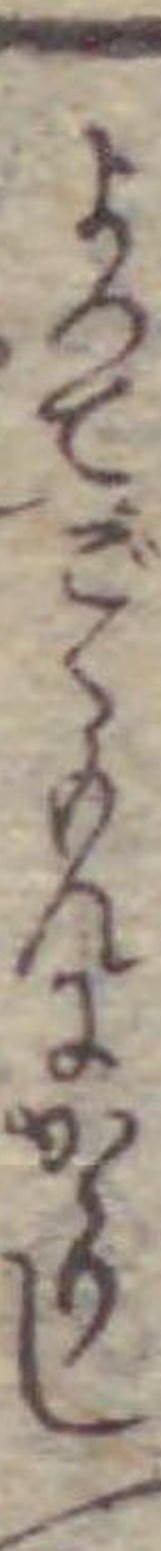よつてごくもんにかゝりし
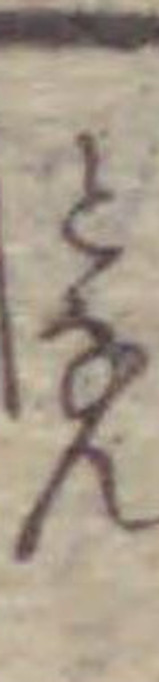となん
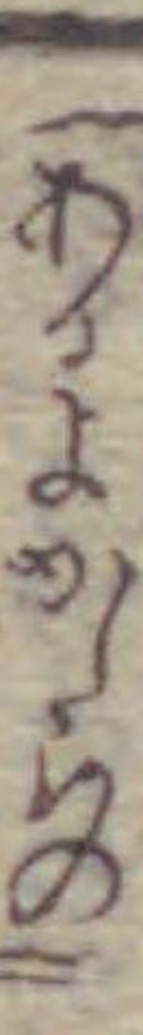〽あるよかしらの
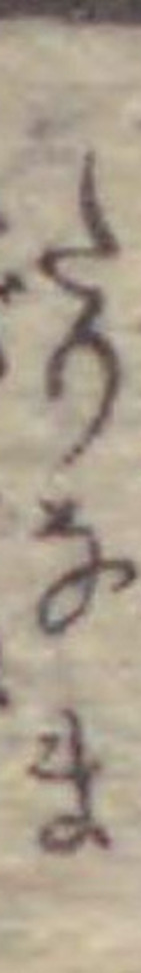たりなま
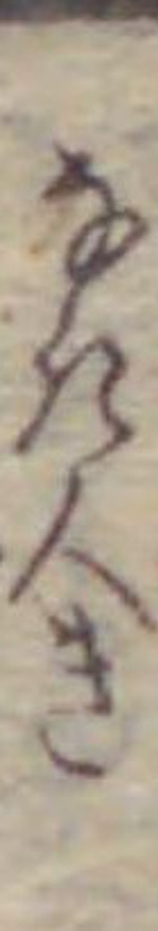なき人き
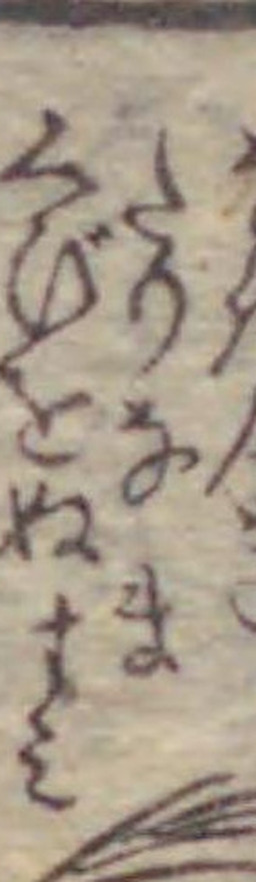くびをぬすみ
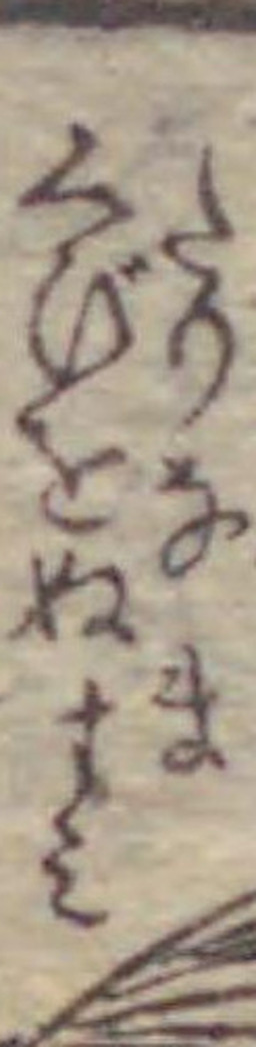くびをぬすみ
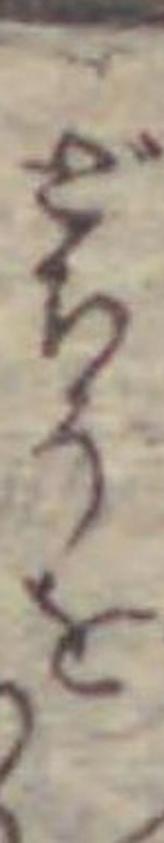どちうを
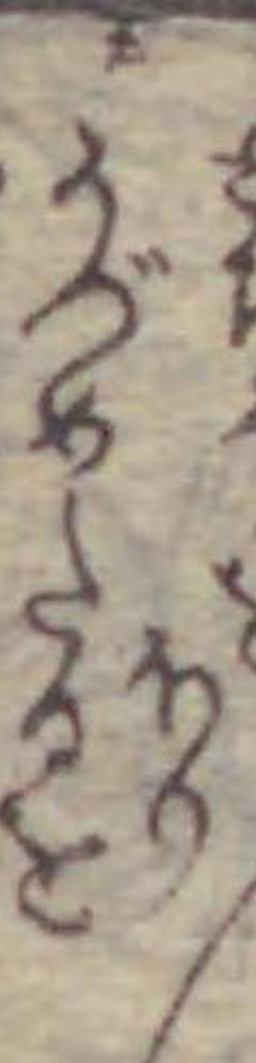うづめたるを
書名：武家物奇談 : 3巻
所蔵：国立国会図書館 National Diet Library, JAPAN
